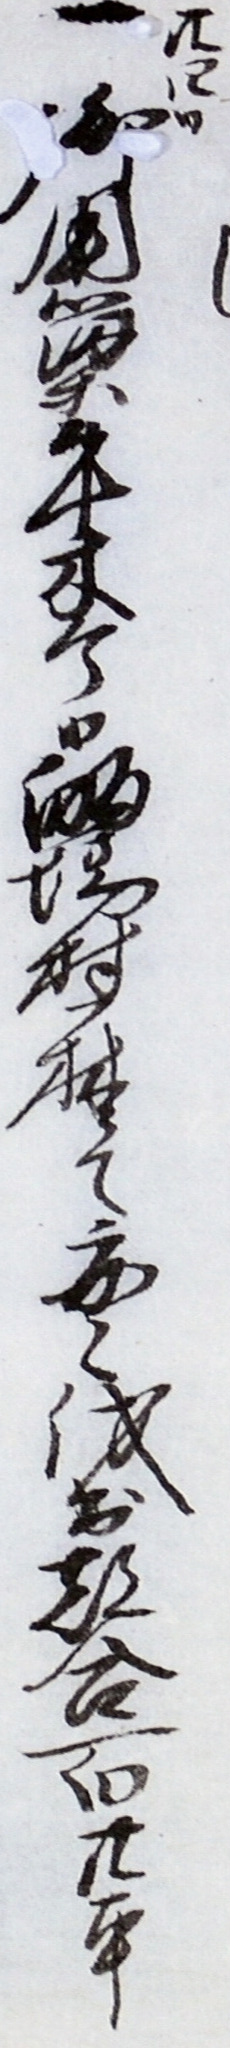一御用簗牛木今日的場村林ニて亦々伐出都合百廿本
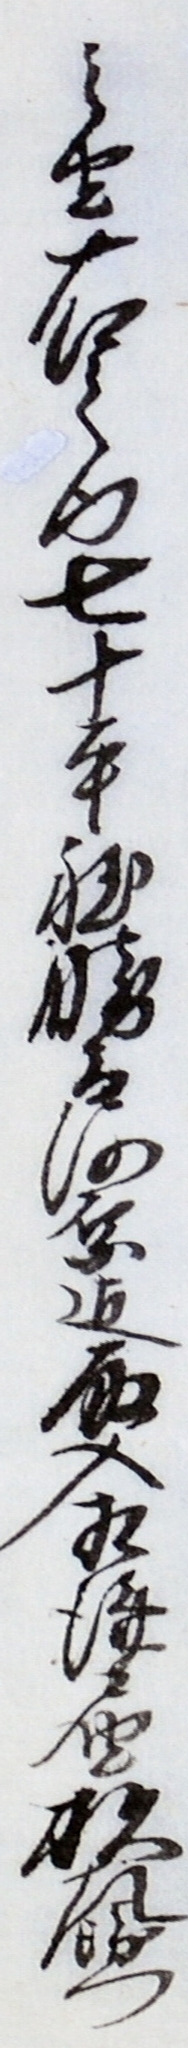之由右之内七十本程勝間河原迄取入相済届杉左衛門
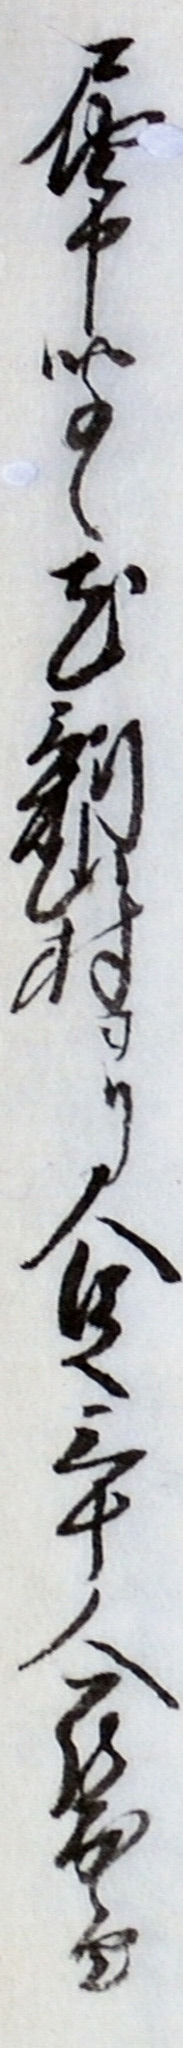雇申聞候尤新山村ヨリ人足三十人罷出候由
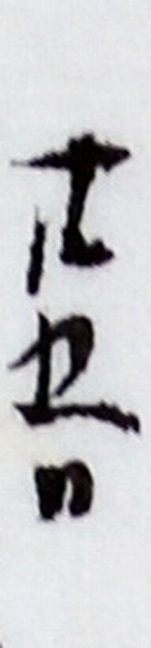廿五日
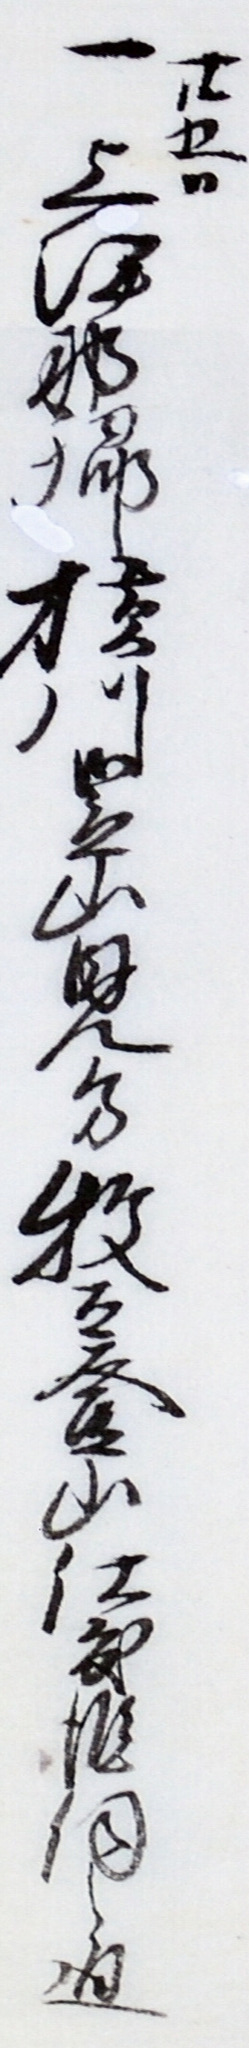一上伊那郷横川御立山見分牧太登山仕度段伺之通
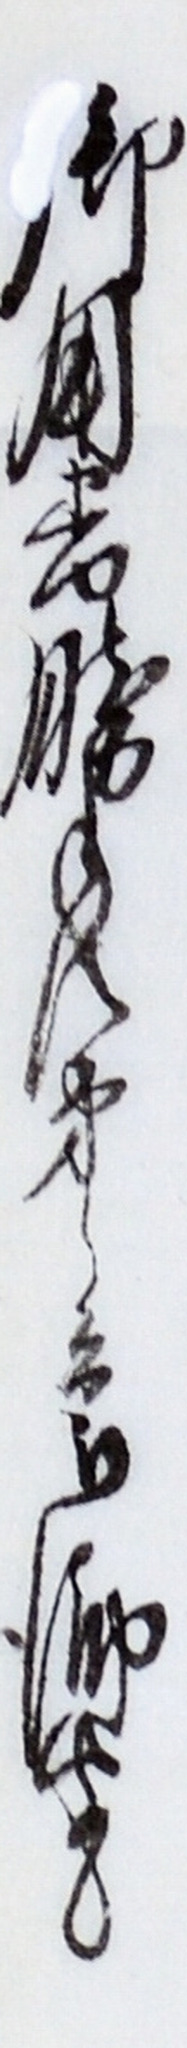御用番勝手次第之旨被仰聞候
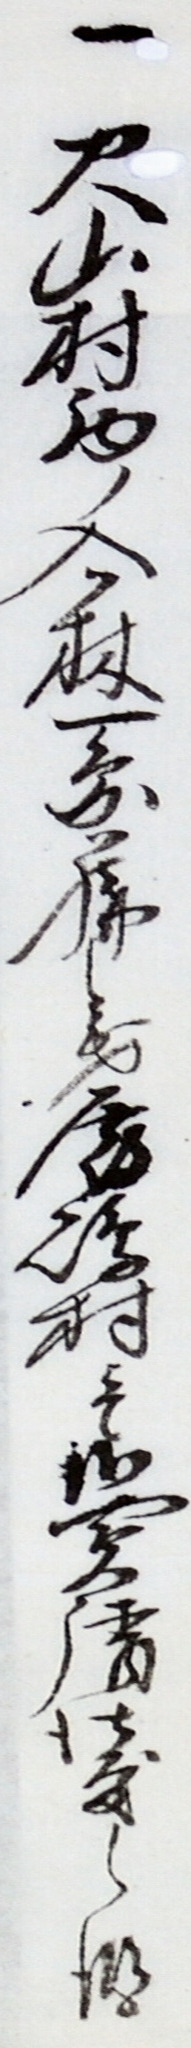一火山村西ノ入御林一円御払之義殿嶋村ニ而御買請仕度候段
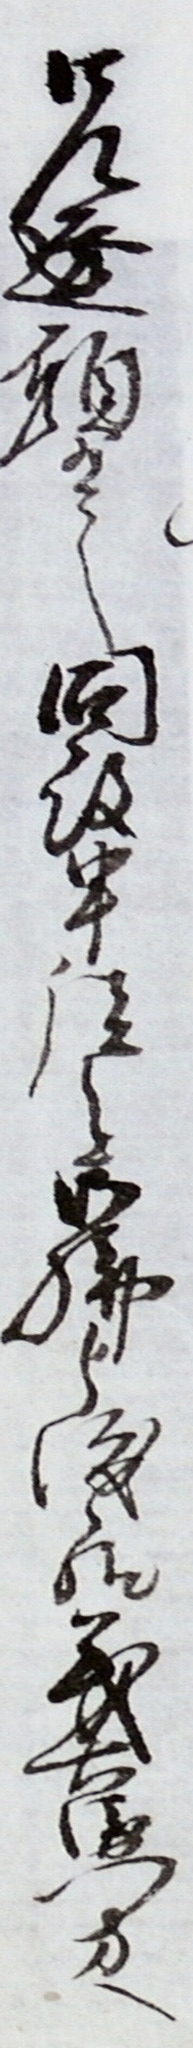先達願有之同役申談之上御払申渡候様義右衛門方へ
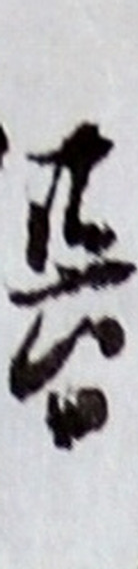廿六日
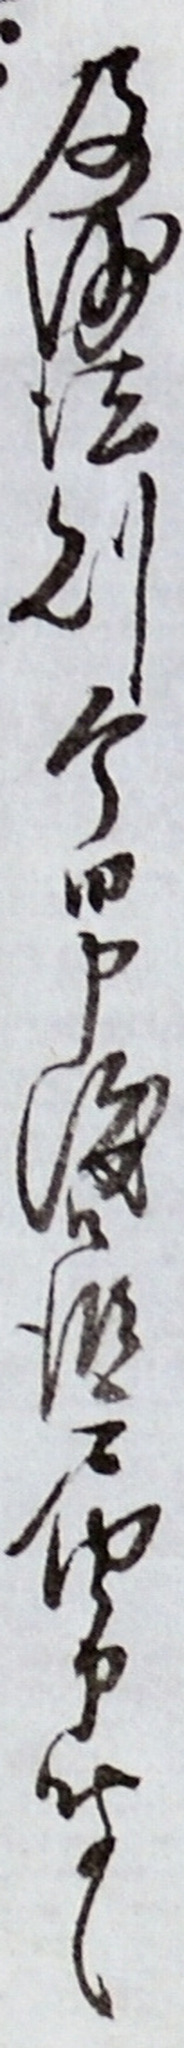及沙汰則今日申渡候段届申聞候
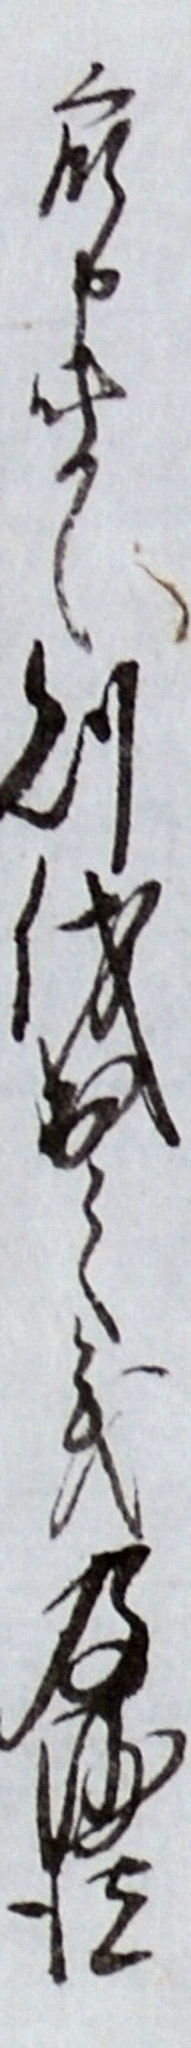衆申聞候則伐出之義及沙汰
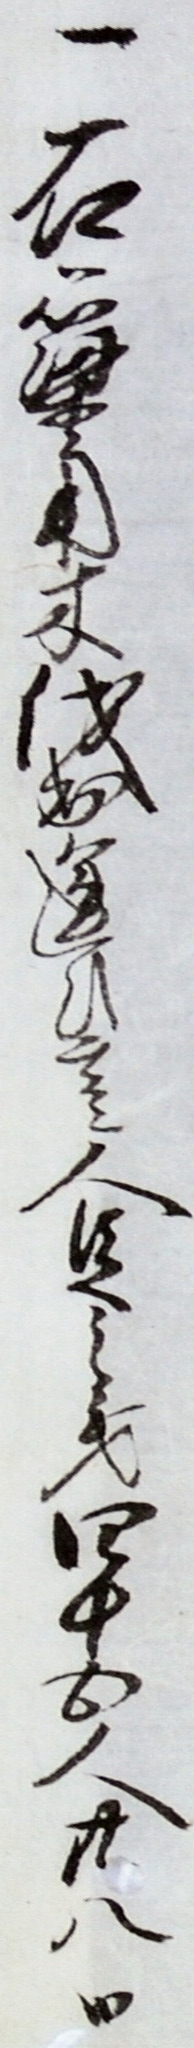一右御簗用木伐出運ひ共ニ人足之義四十五人廿八日

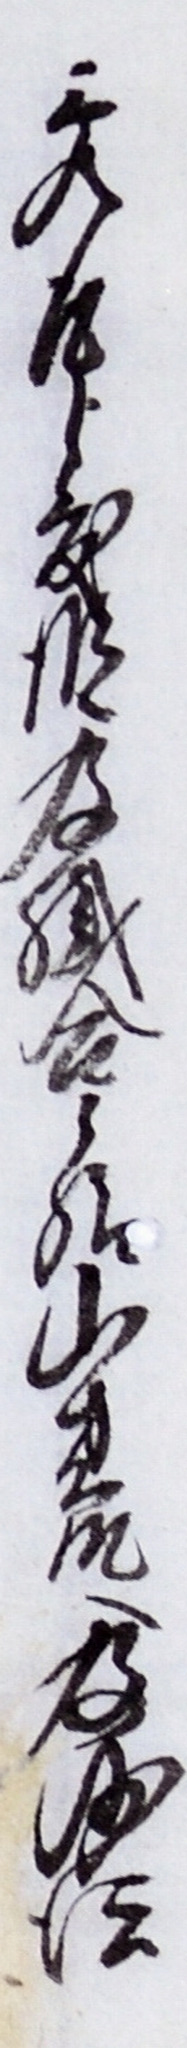受取申度段及掛合候様山方衆へ及沙汰
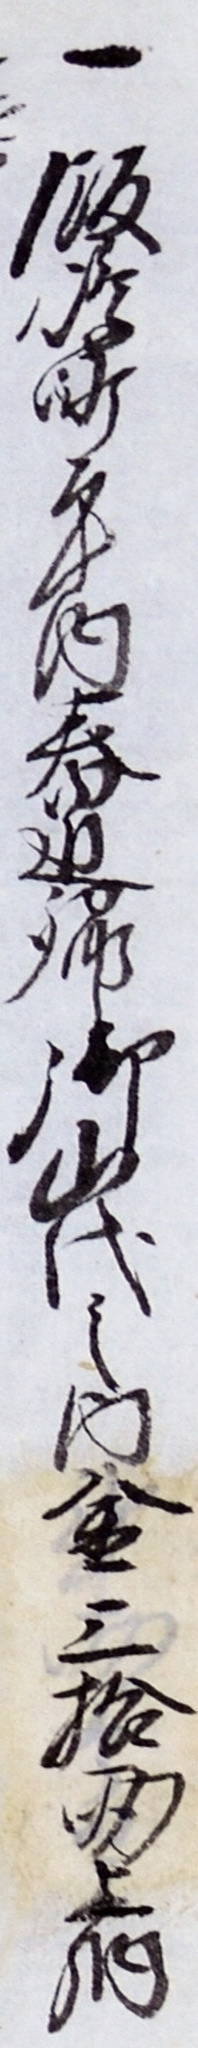一飯嶋町平内春近郷御山代之内金三拾両上納
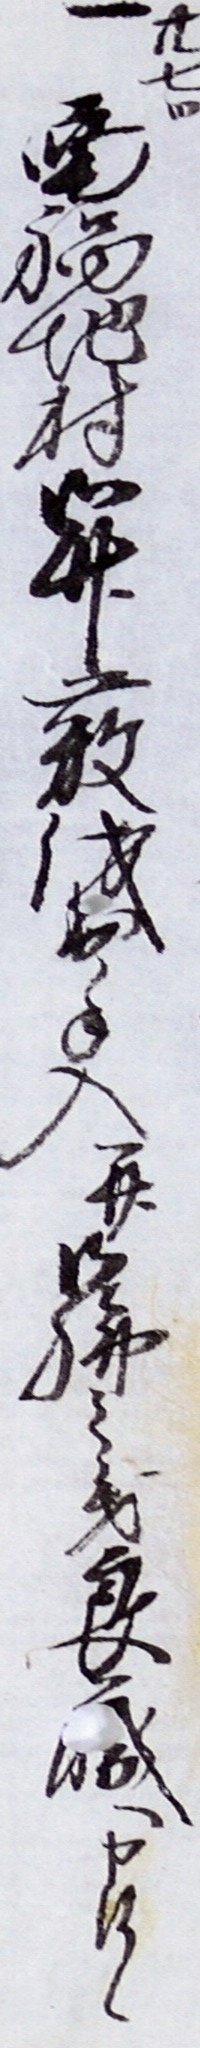一南福地村御竹薮伐出手入并御払之義良蔵へ申付候
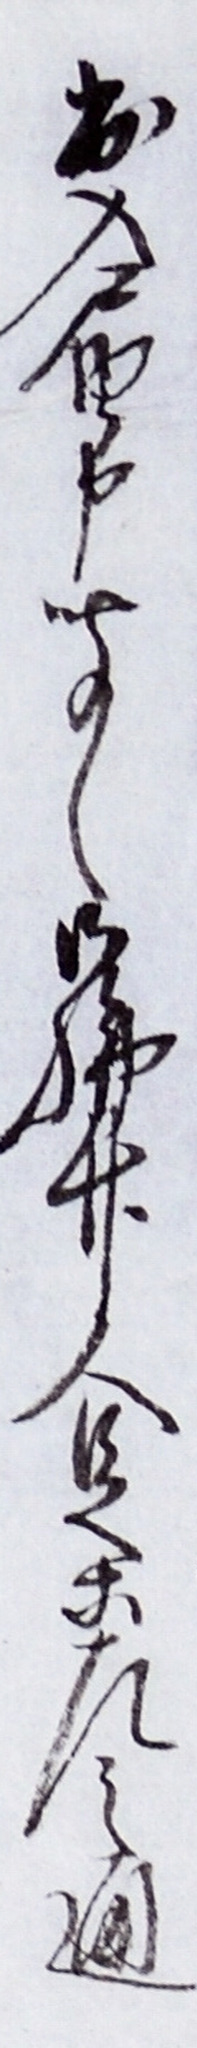出入届申聞候御払竹人足等左之通
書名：御山奉行御用控
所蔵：伊那市立高遠町図書館・合同会社AMANE
